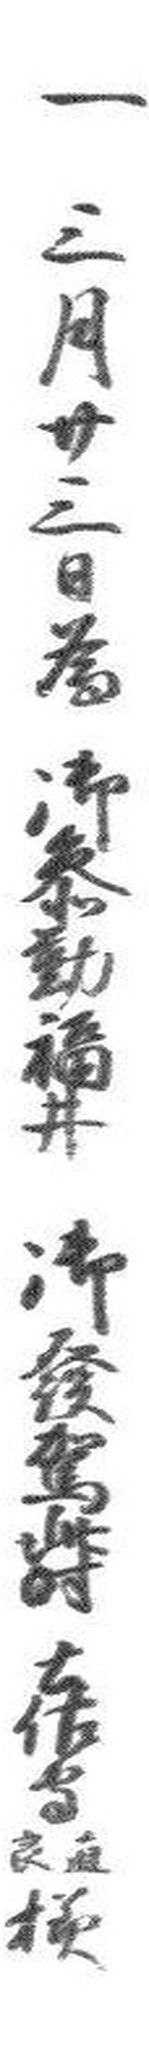一三月廿三日為御参勤福井御発駕此時土佐守直良様
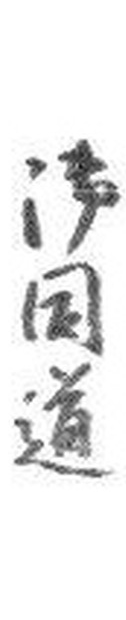御同道
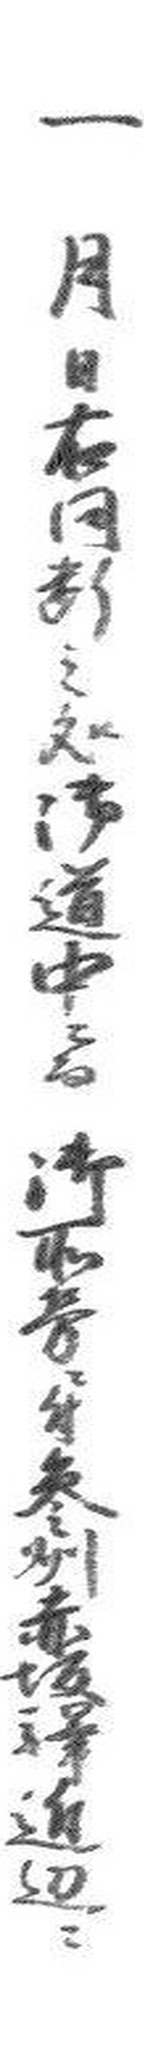一月日右同断之処御道中ニ而御所労ニ付参州赤坂駅近辺ニ
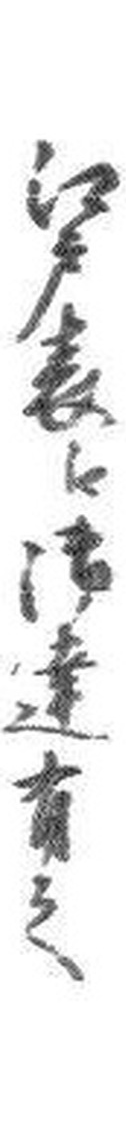江戸表江御達有之
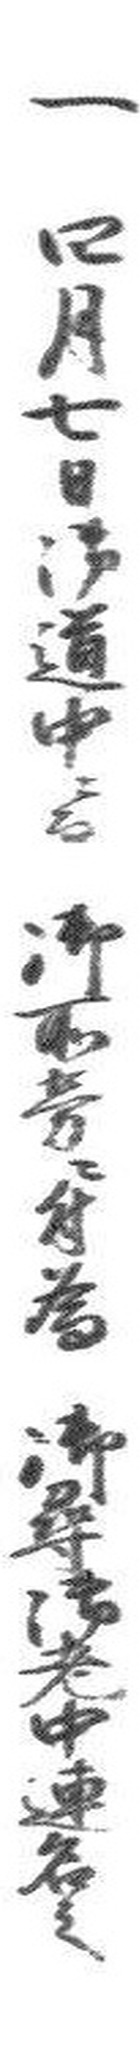一四月七日御道中ニ而御所労ニ付為御尋御老中連名之

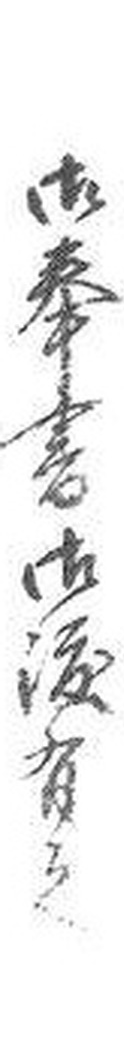御奉書御渡有之
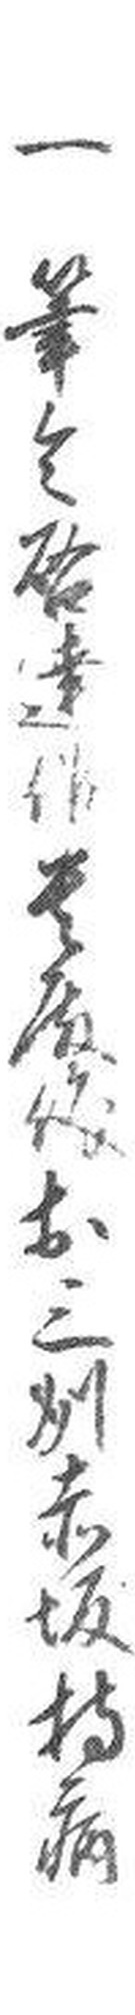一筆令啓達候貴殿儀於三州赤坂持病
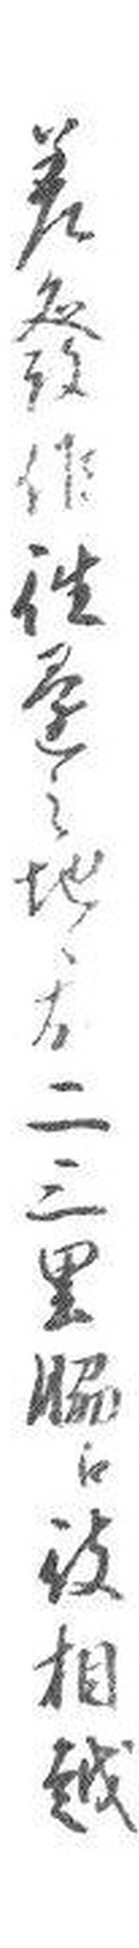差発候往還之地候故二三里脇江被相越
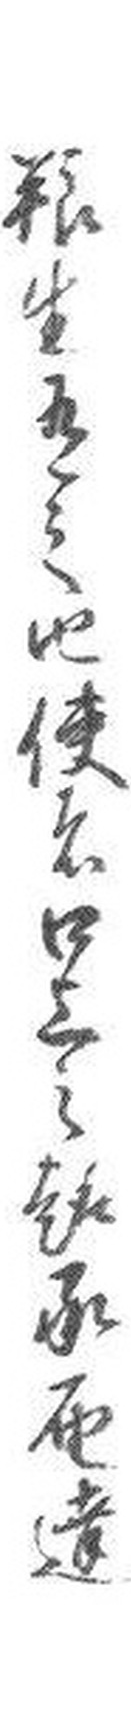養生有之由使者口上之趣承届達
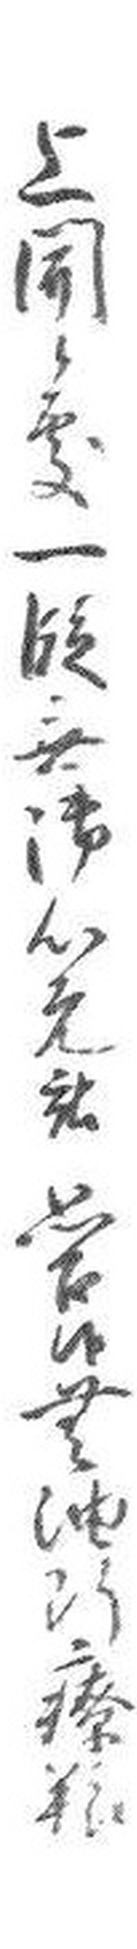上聞候処一段無御心元被思召候無油断療養
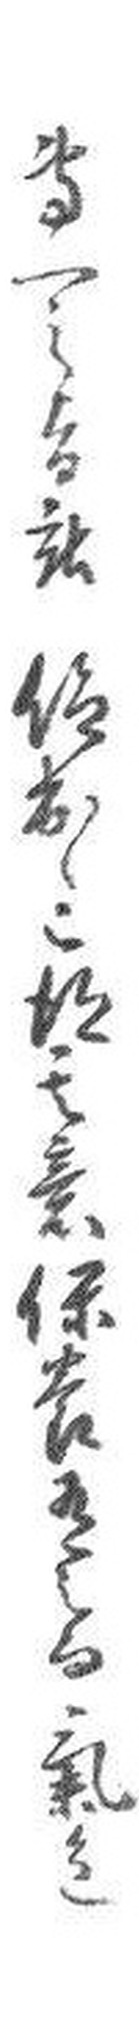専一之旨被仰出候被得其意保養有之而気色
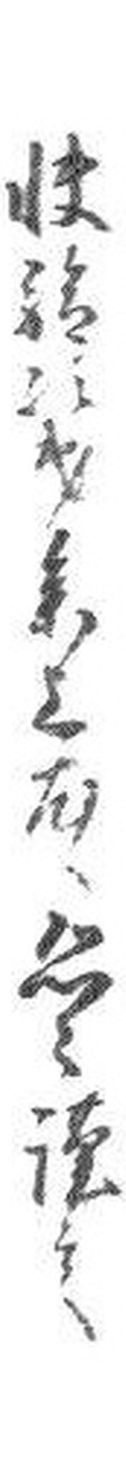快験次第参上尤候恐々謹言
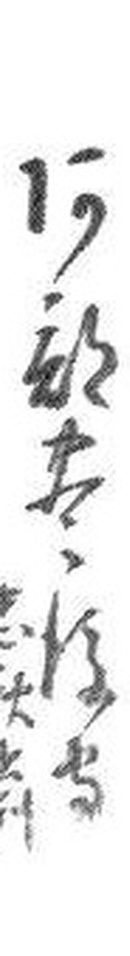阿部豊後守
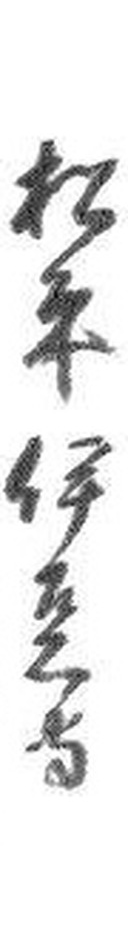松平伊豆守
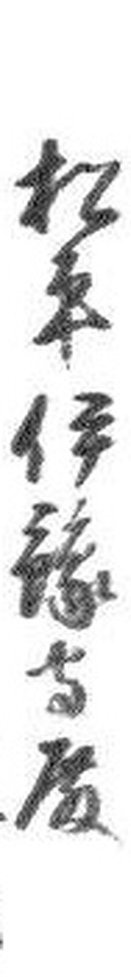松平伊予守殿
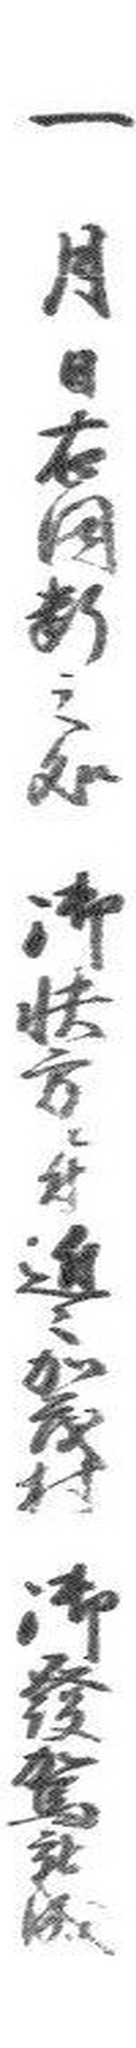一月日右同断之処御快方ニ付近々加茂村御発駕被成
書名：家譜 四 忠昌公 従寛永七年到正保四年
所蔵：福井県文書館 Fukui Prefectural Archives
